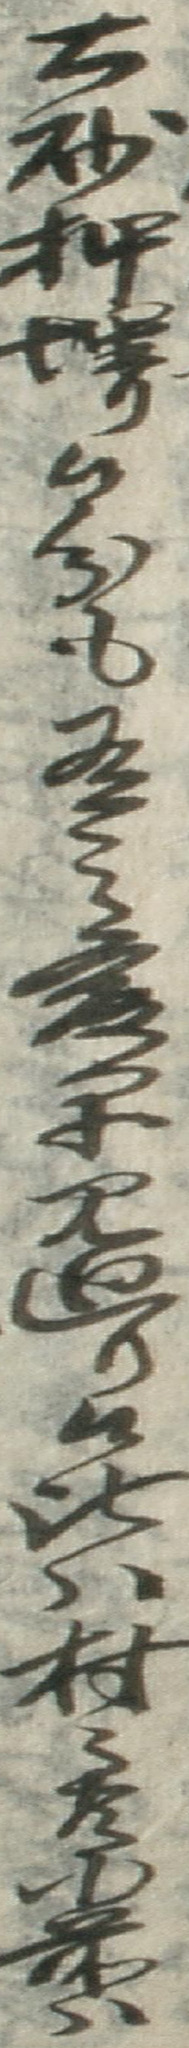土砂押埋り候分も有之,最早見廻り候此ハ村々共小前ハ
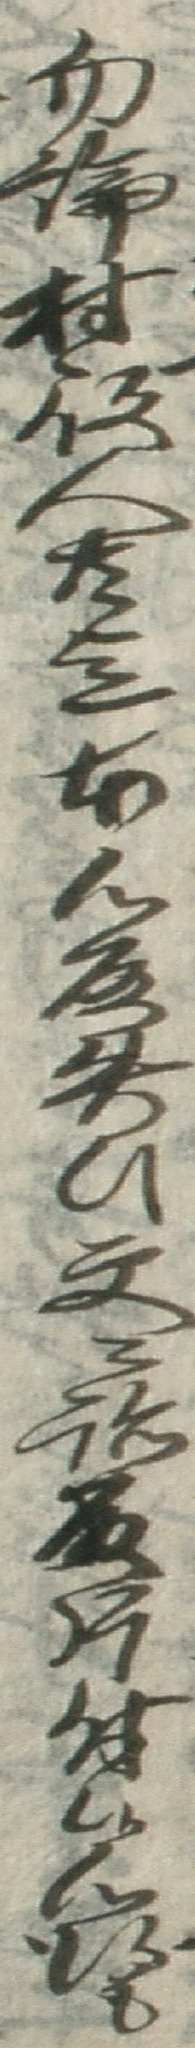勿論村役人共迄本心取失ひ更二跡取片付候心得も
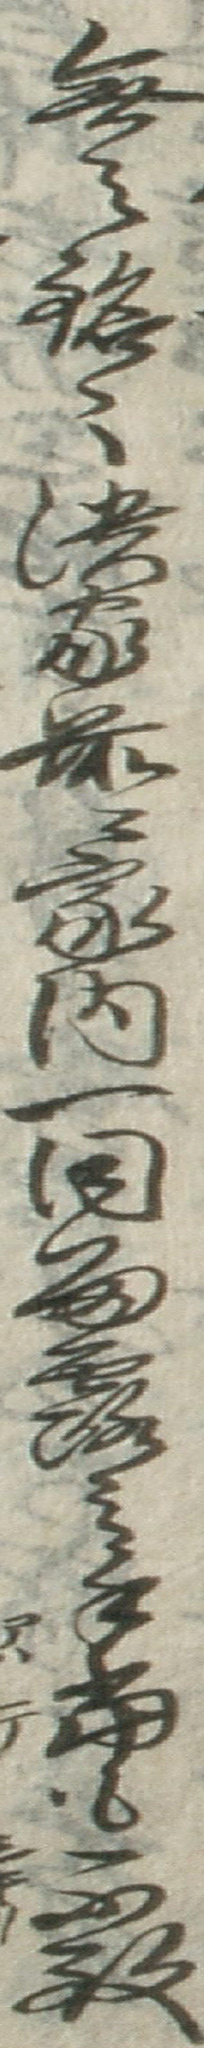無之銘々潰家前二家内一同雨露之手当も不致
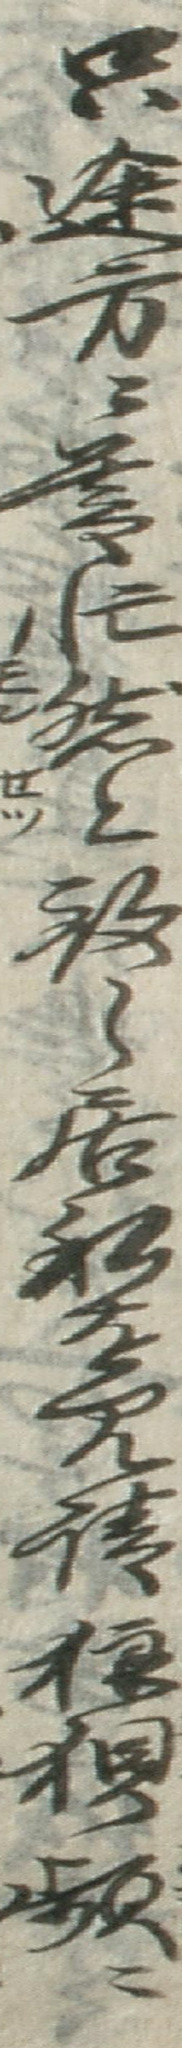只途方二暮茫然と致し居私を見請狼狽頻二
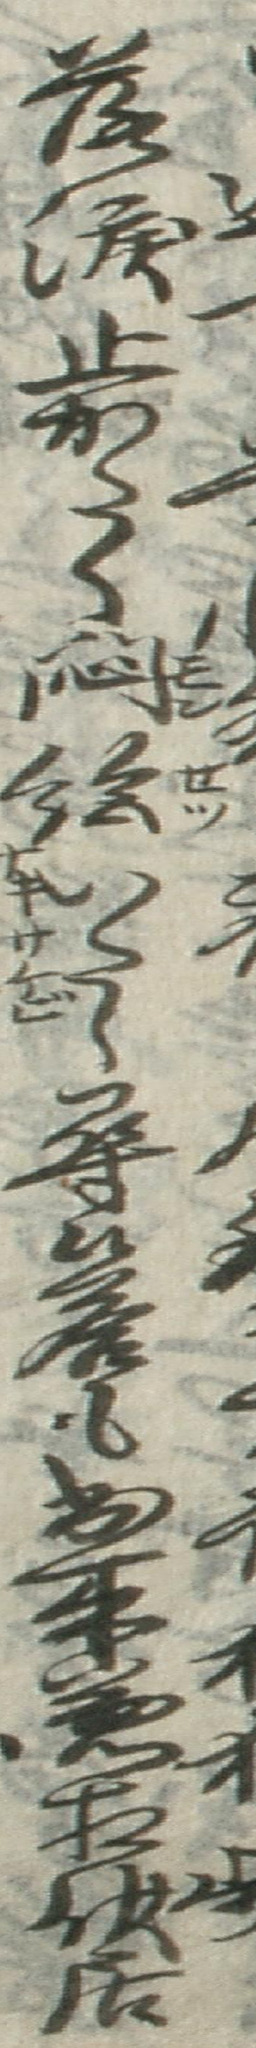落涙止かたく悶絶いたし尋候答も出来兼相伏居
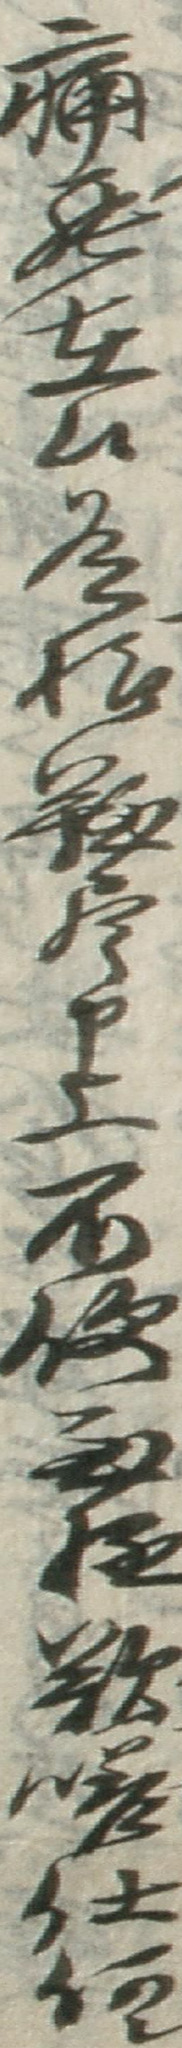痛罷在候有様難盡申上不便至極歎嗟仕何ㇾ
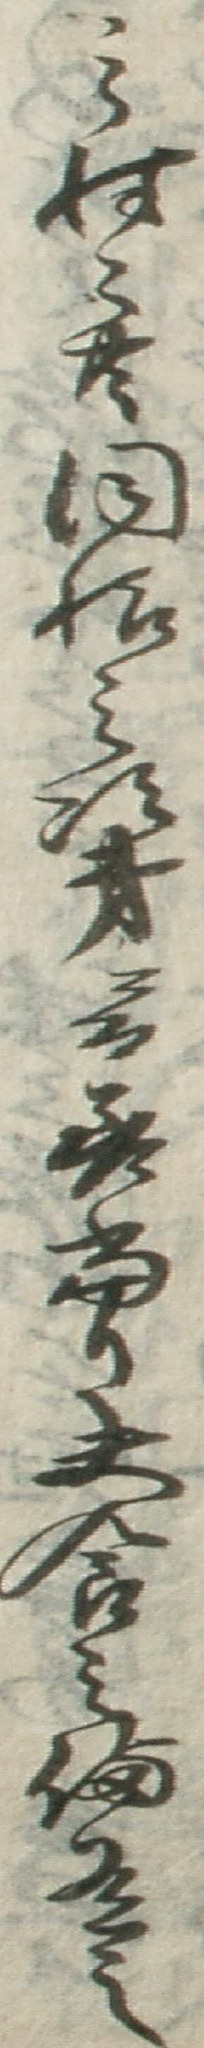之村々共同様之次第二而差当り夫食之備有之

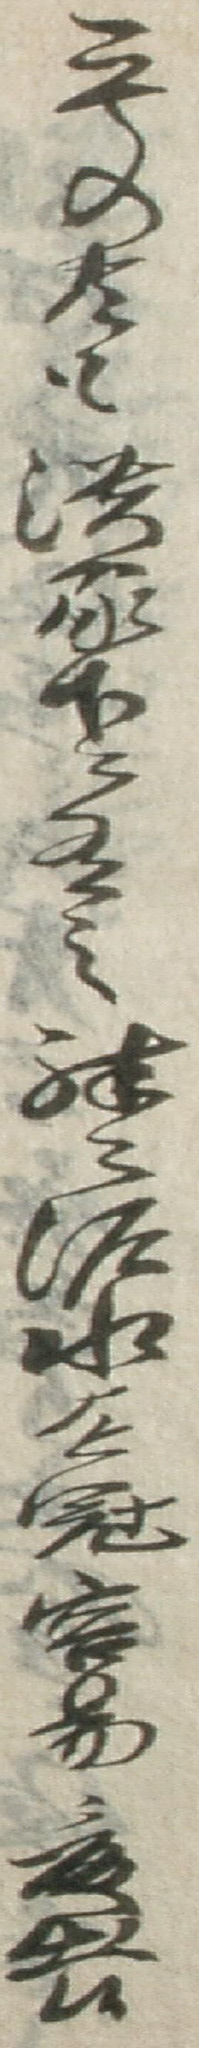もの共も潰家下二有之殊二泥水を冠容易二取出候
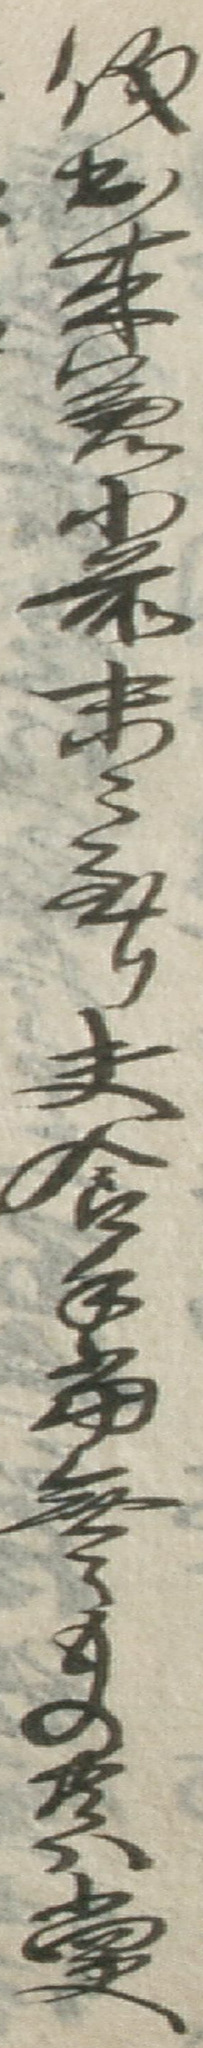儀出来兼小前末々至り夫食手当無之もの共は尚更
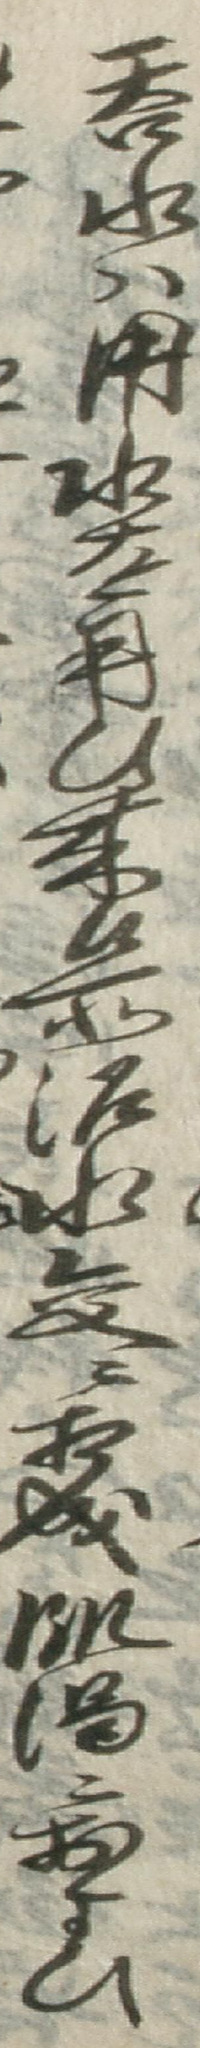呑水は用水を用ひ来候所泥水交二相成飢渇二およひ
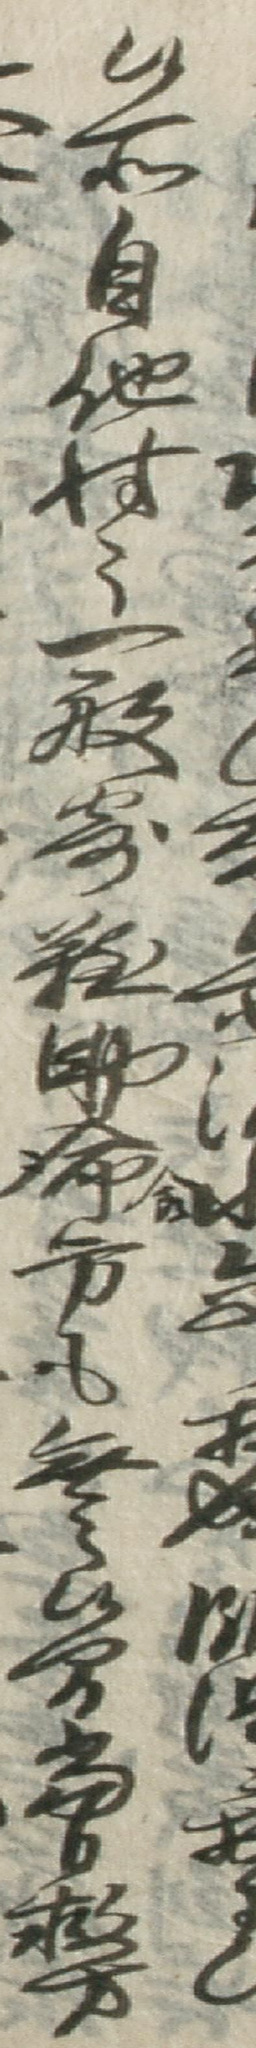候所自他村々一般寄難助命方も無之候間当日救方
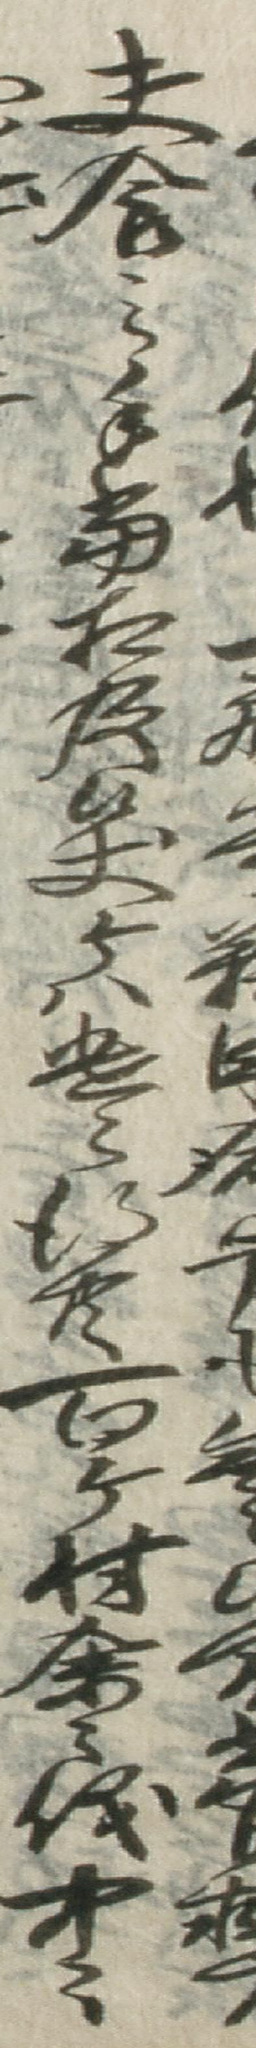夫食之手当相及候丈ヶは遣候得共百ヶ村余之儀中々
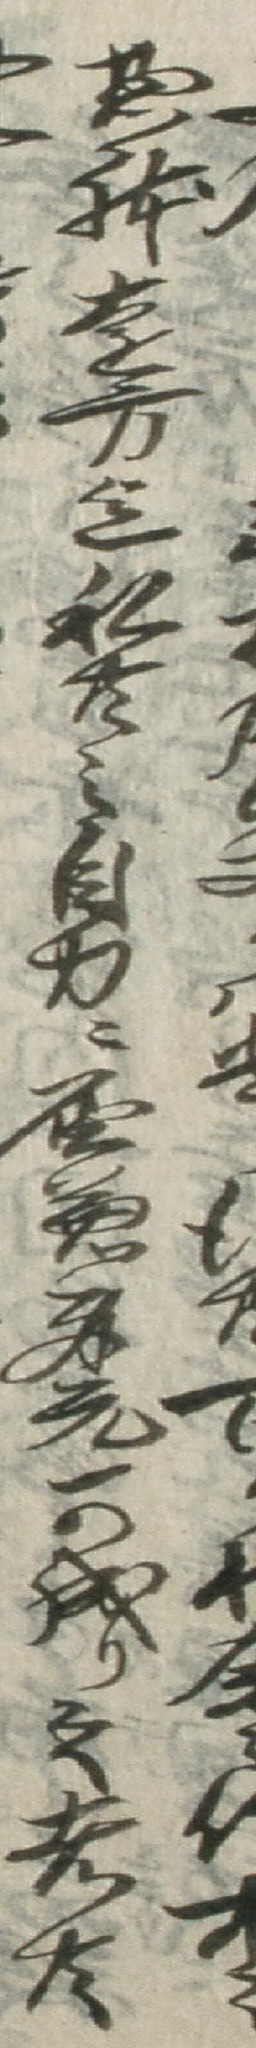惣躰遠方迄私共之自力二届兼身元可成り之者共
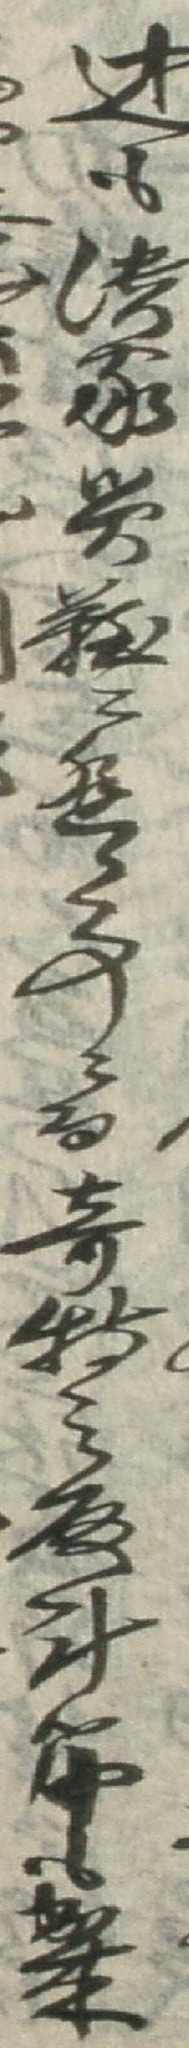迚も潰家災難ニ逢候事二而奇特之取計筋も出来
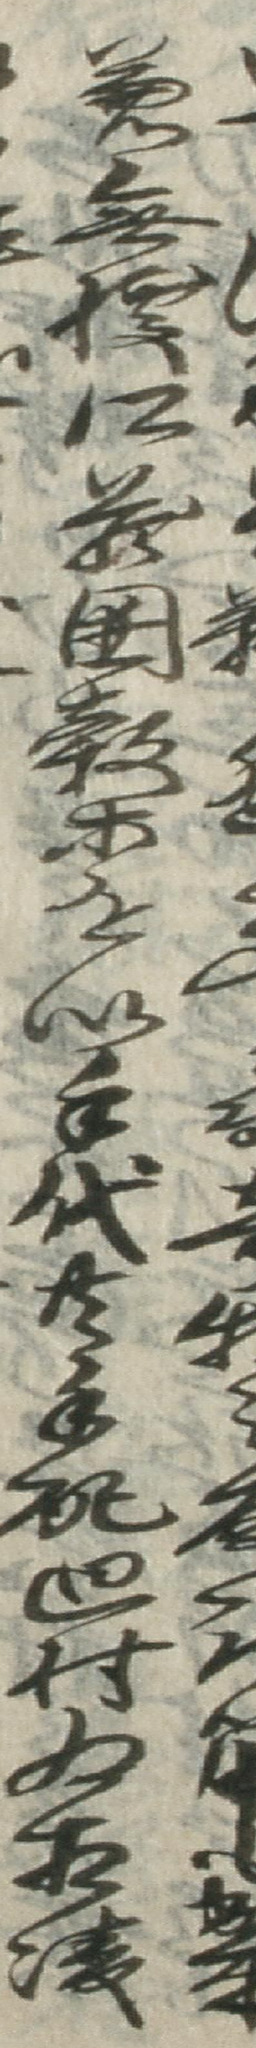兼無拠郷蔵囲穀等を以手代共手配廻村為相凌
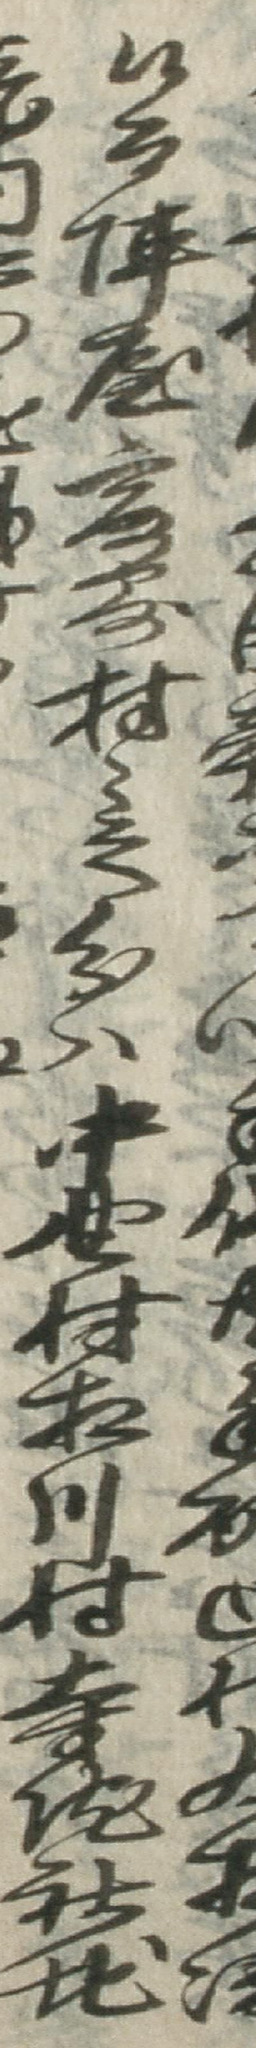候而陣屋最寄村々之分は中曲村相川村寺院社地
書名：信濃國地震實録記
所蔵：東京大学地震研究所図書室 Earthquake Research Institute Library, The University of Tokyo, JAPAN
